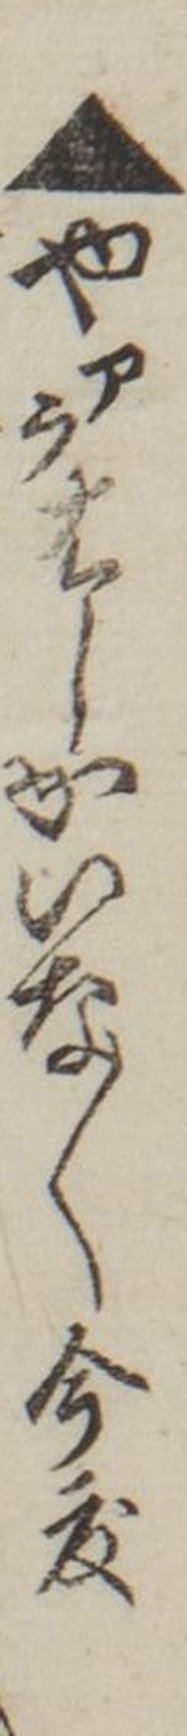▲やアラはしかいな〳〵今度
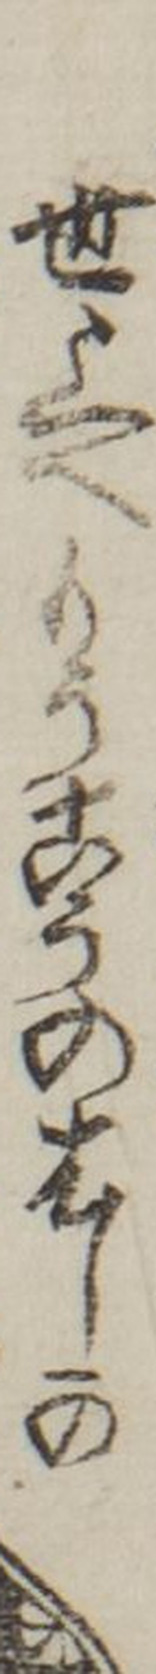世上へりうこうのはしか
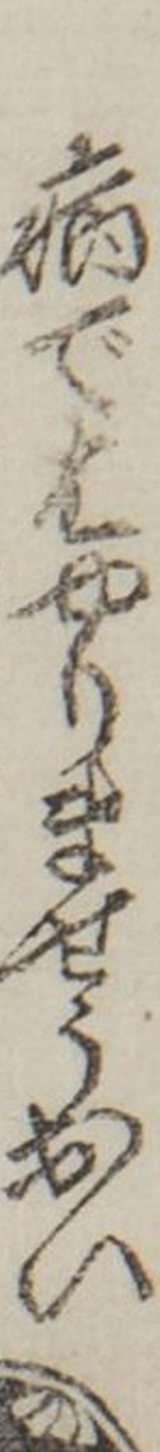病ではやりませうおい
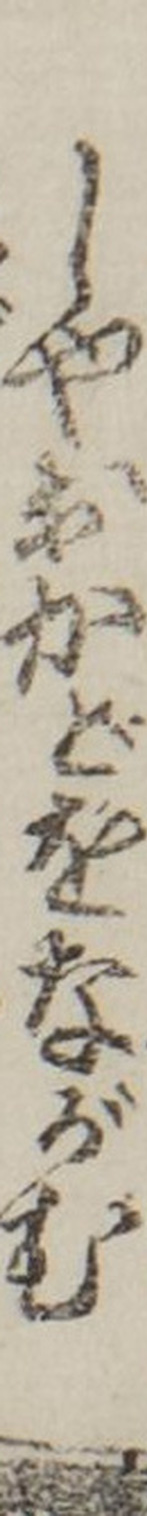しやおかどをながむ
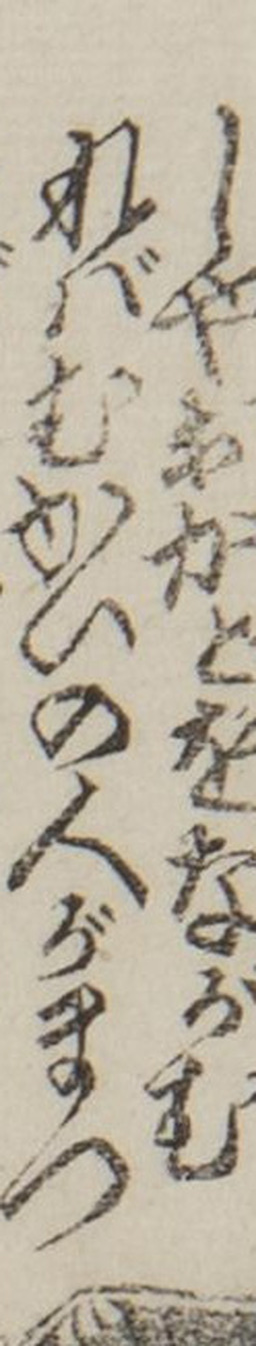ればむかいの人がまつ
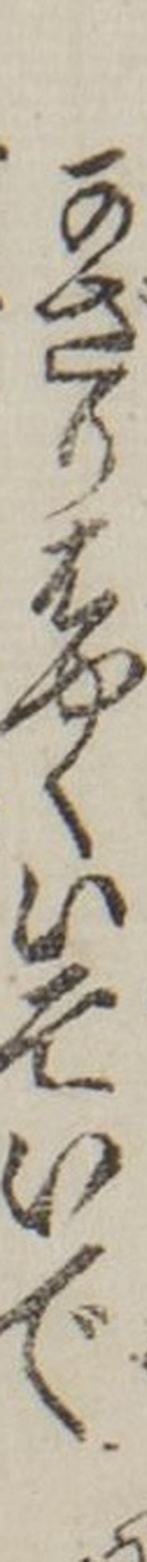かざりはやくいそいで
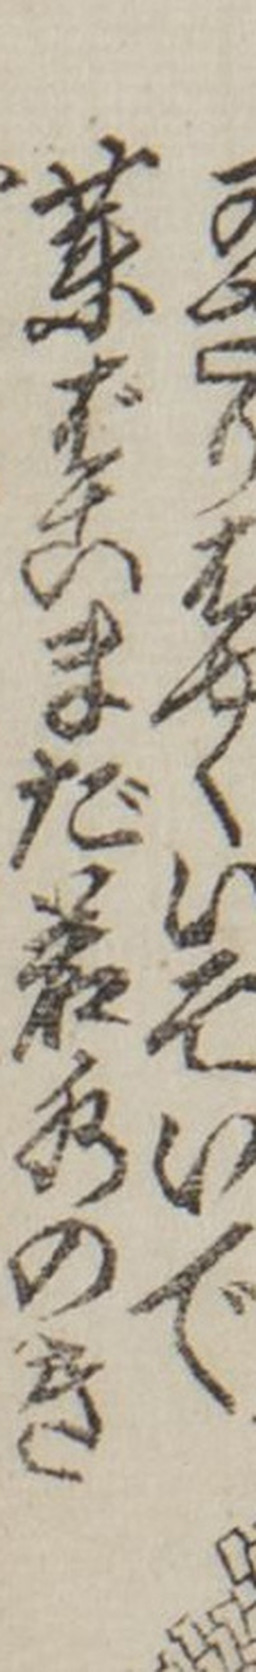薬ばこまだ若水のき
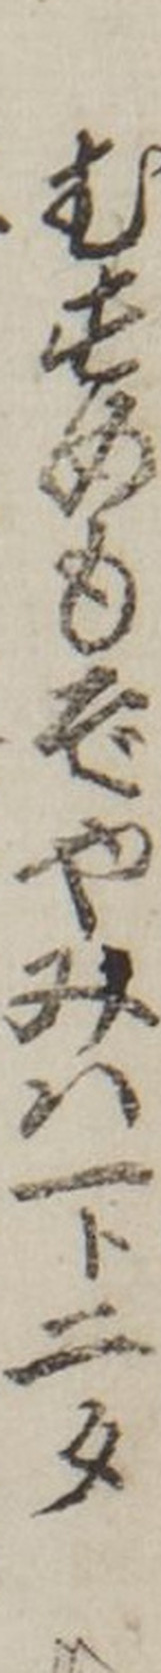むすめもぞやみは一ト二タ
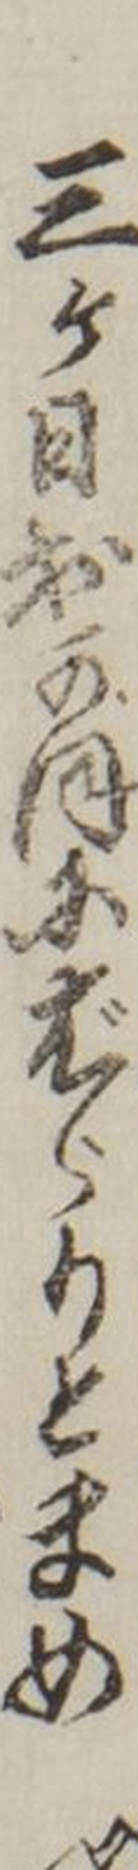三ヶ日おかめにばらりとまめ
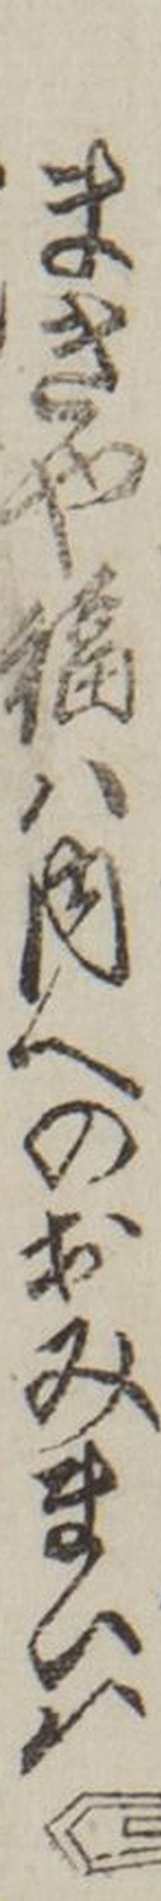まきや福は内へのおみまいは
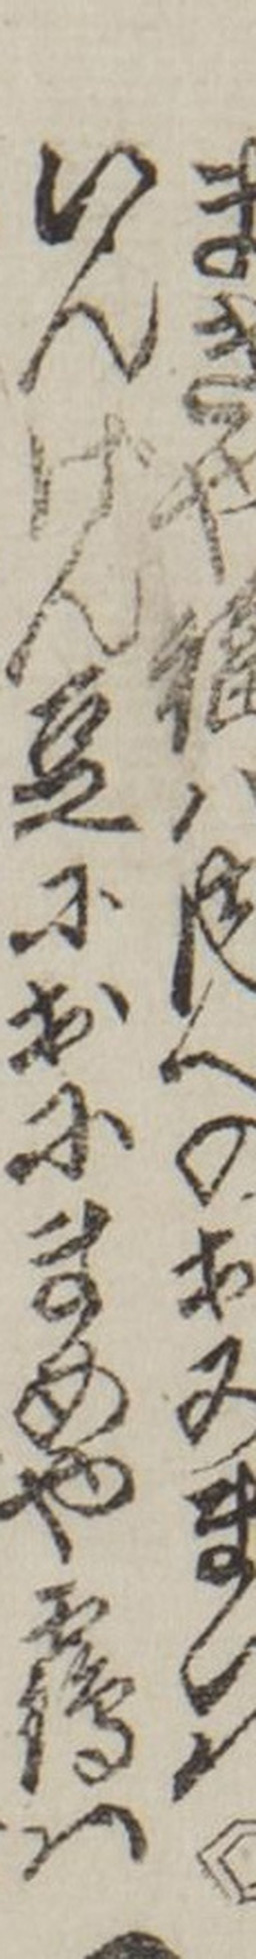いんげん豆におにまめや鶴は
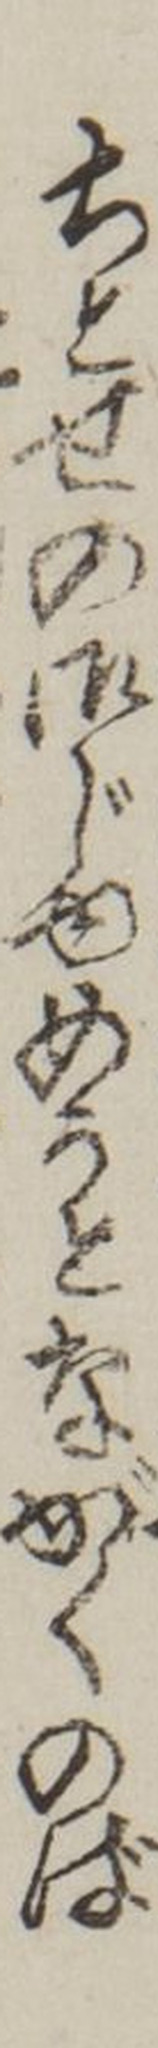ちとせの御じゆめうとながくのば
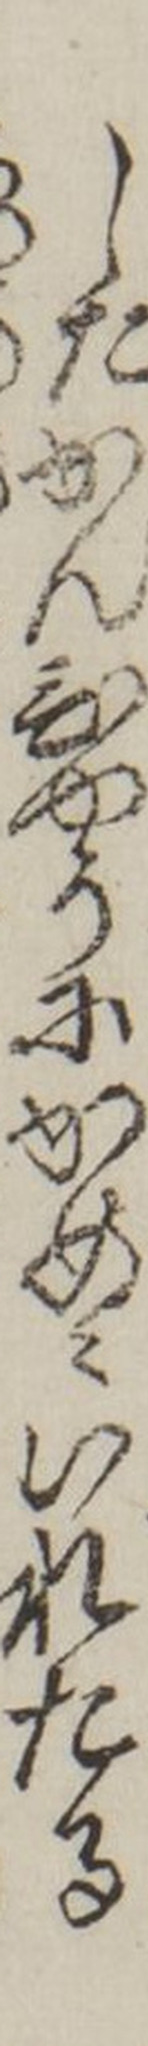したかんひやうにかめにいれたる
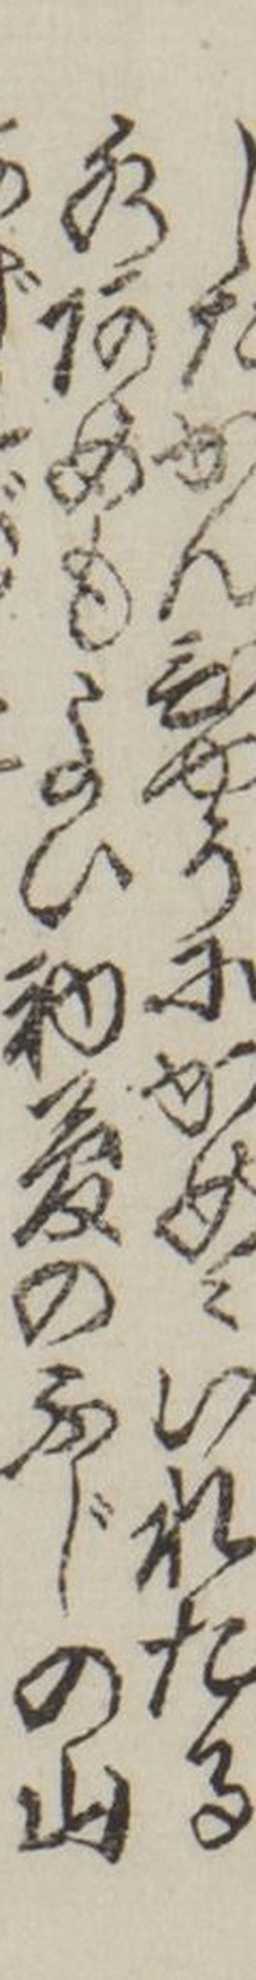水あめもよひ初夢のふじの山
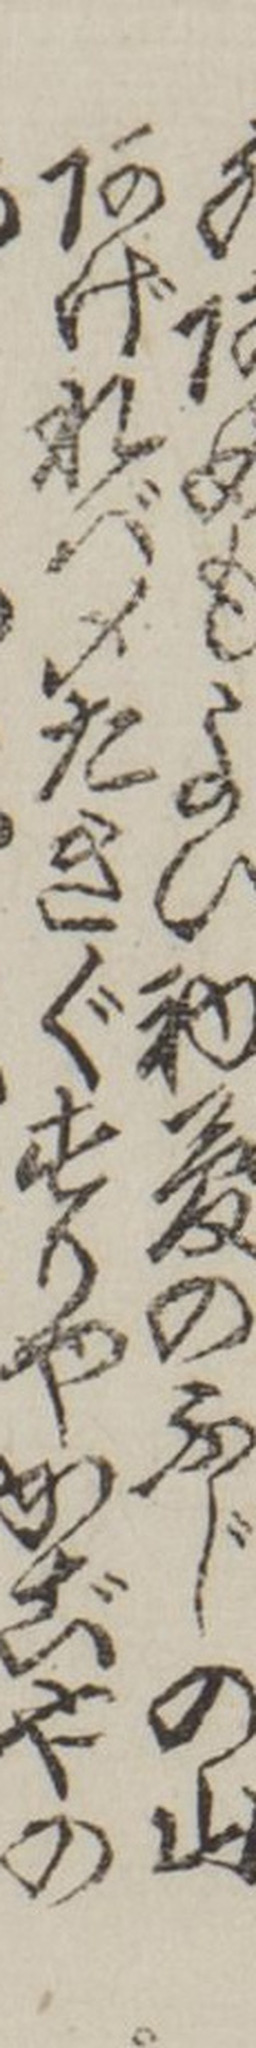あげれば〆たきぐすりやかごやの
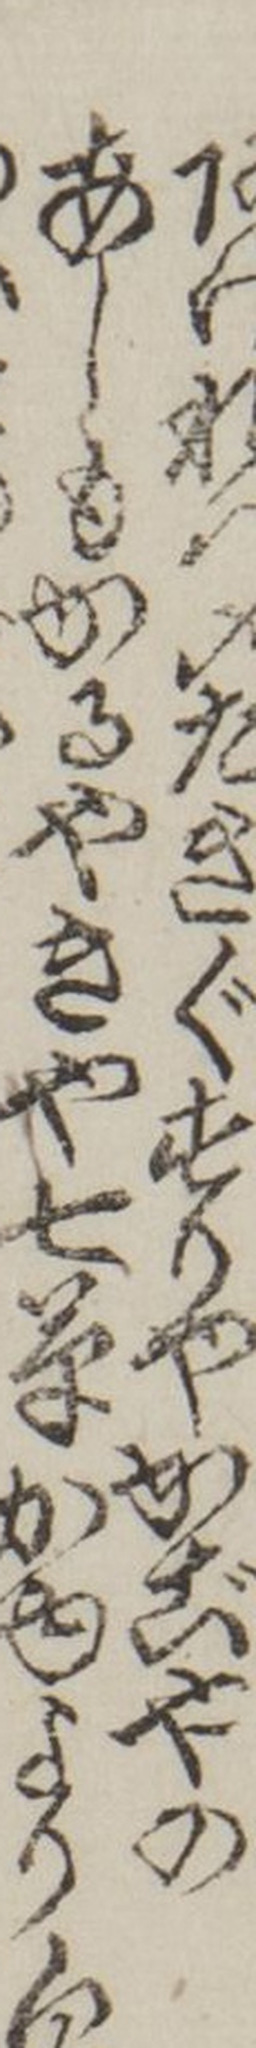あしもかるやきや七草かゆより白
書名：流行痲疹やくばらい
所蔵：あいおいニッセイ同和損保株式会社
